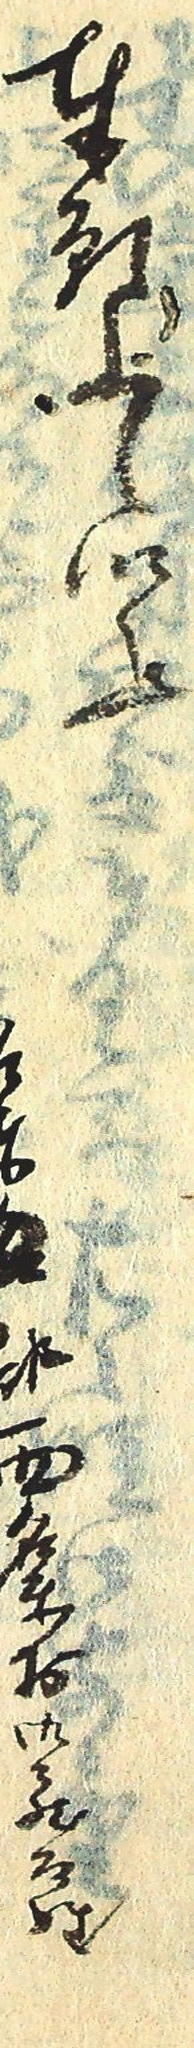奉願上候以上
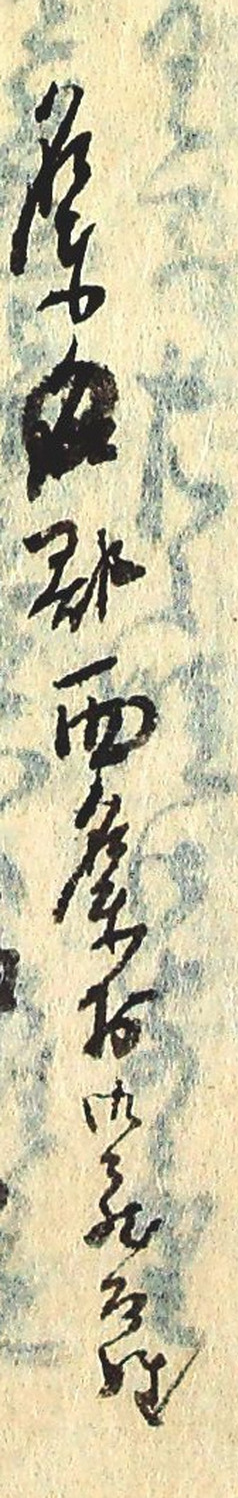名東郡西名東村御蔵百姓
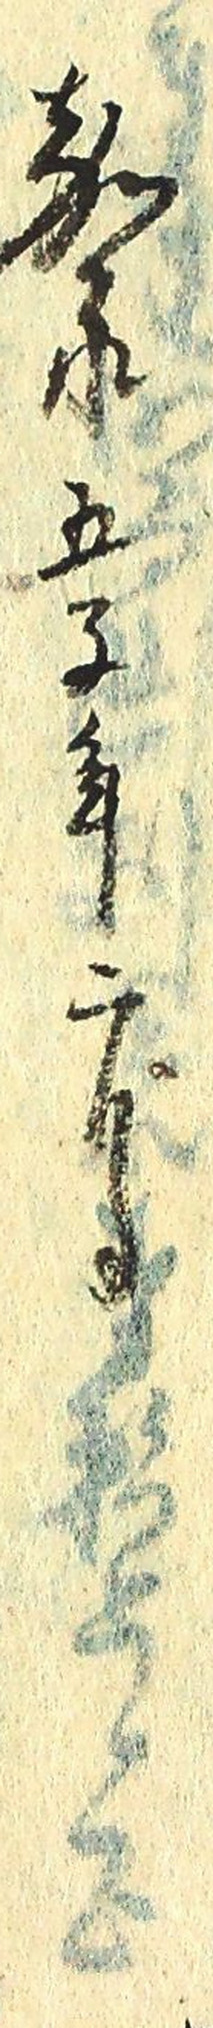嘉永五子年二月
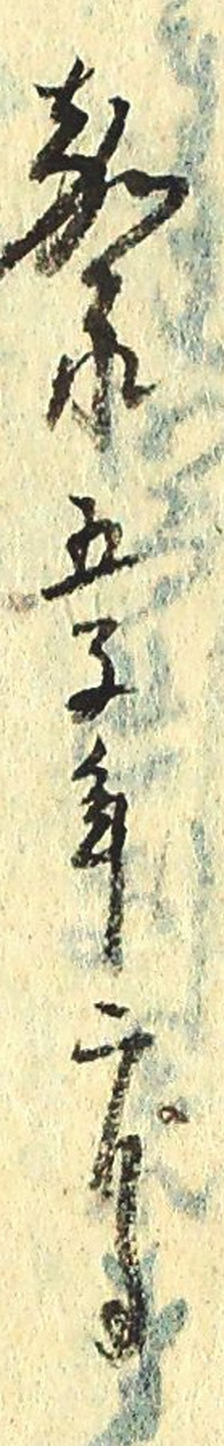嘉永五子年二月
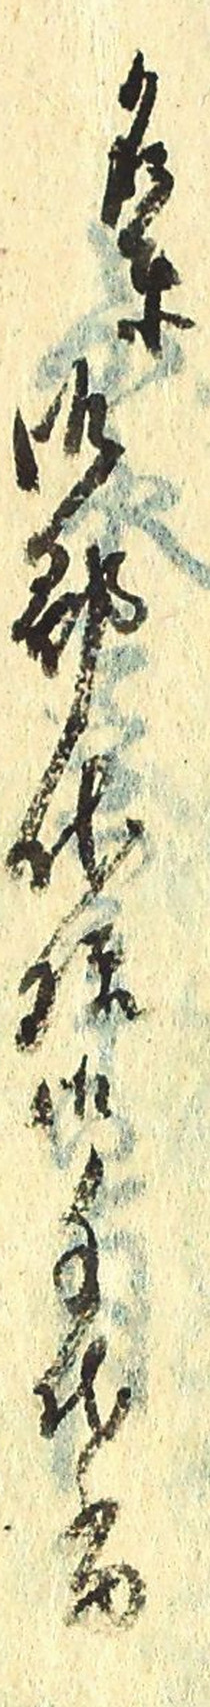御郡代様御手代当
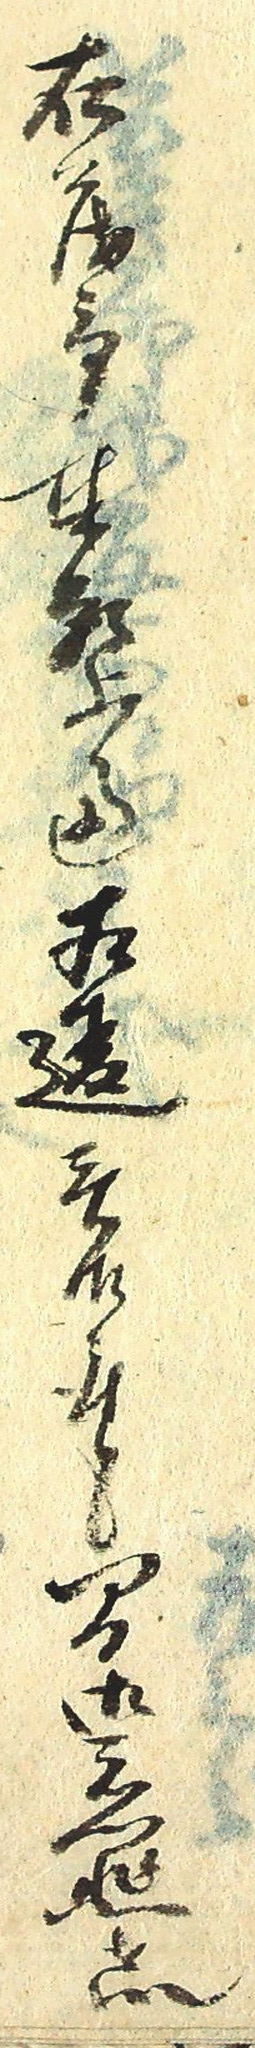右茂市奉願上通相違無御座候間御慈悲を以
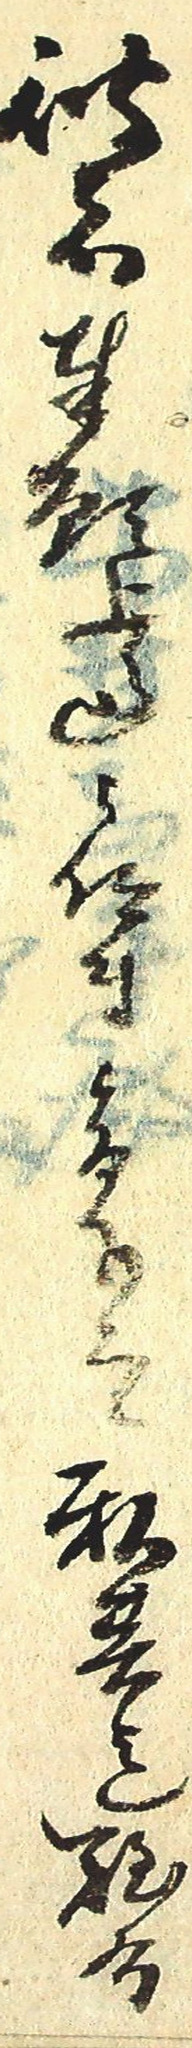彼者奉願上通被仰付被為下候はゝ私共迄難有
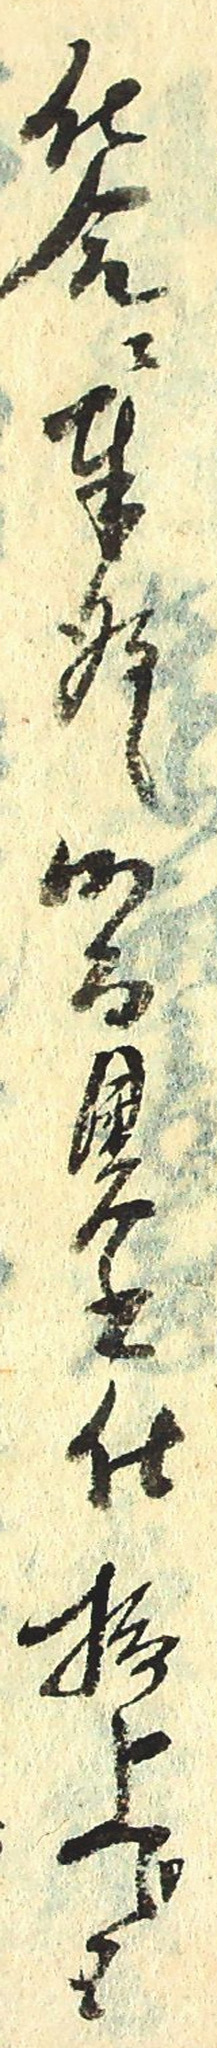仕合に奉存候仍て奥書仕指上候以上
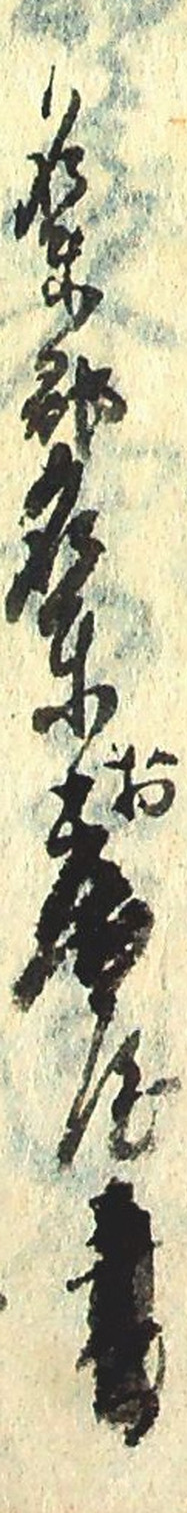名東郡名東村庄屋
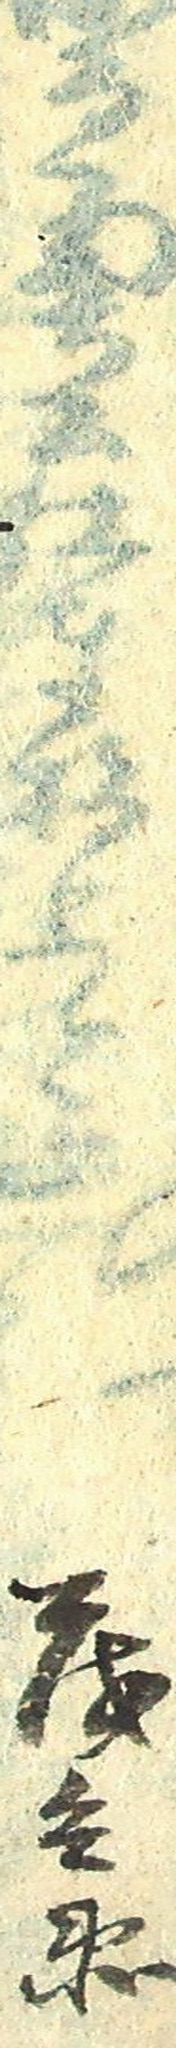茂兵衛
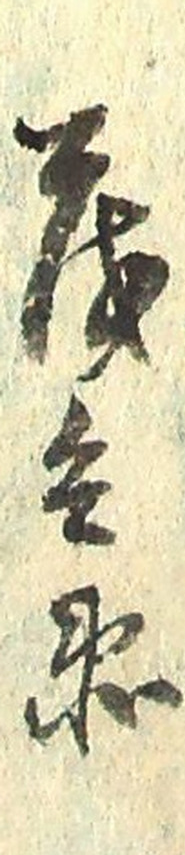茂兵衛
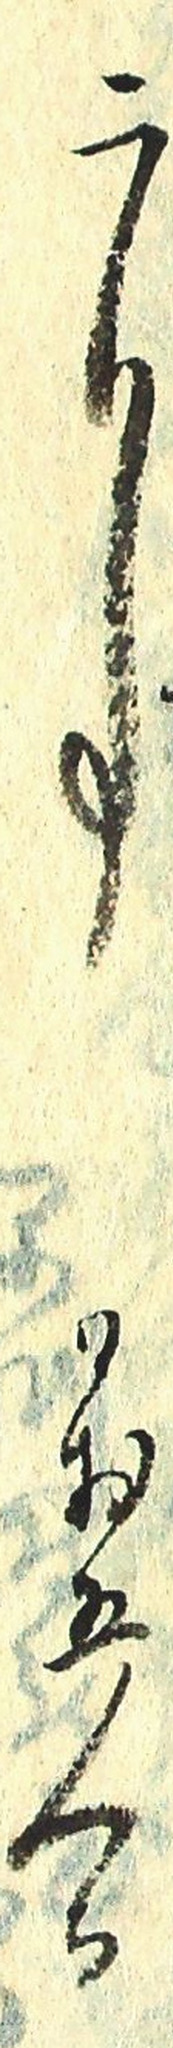二月同村五人与
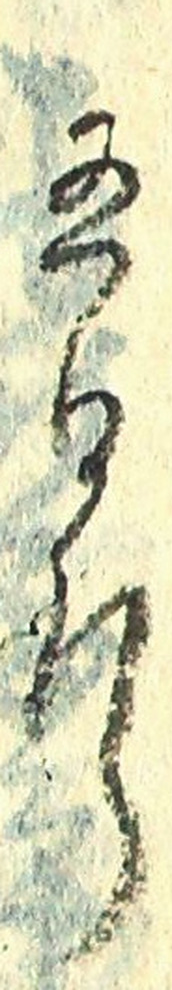右同断

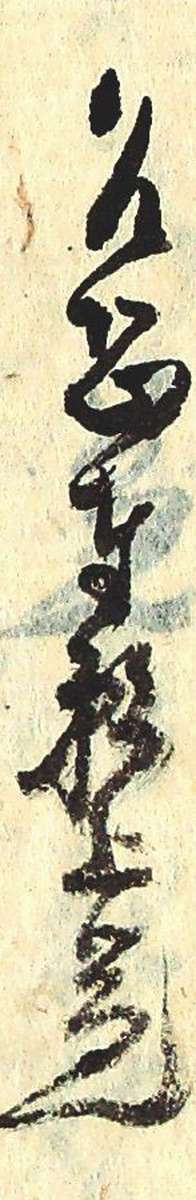乍恐奉願上覚
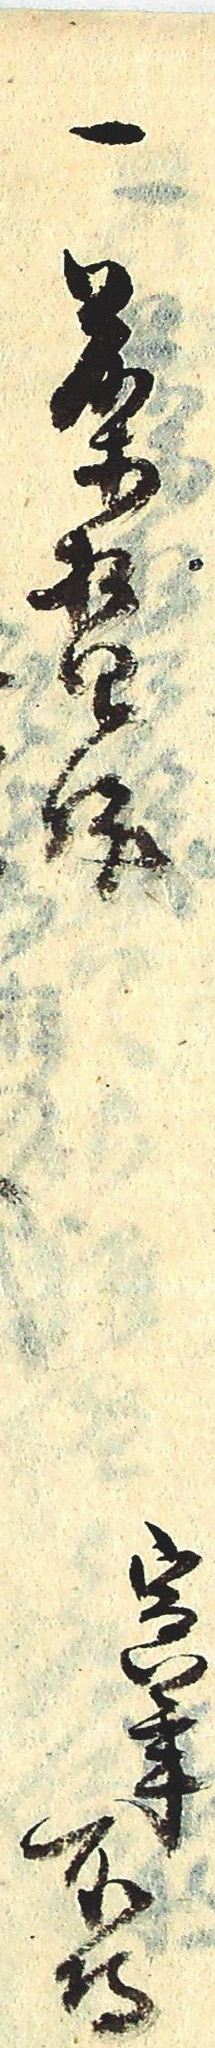一蒅拾四俵所持
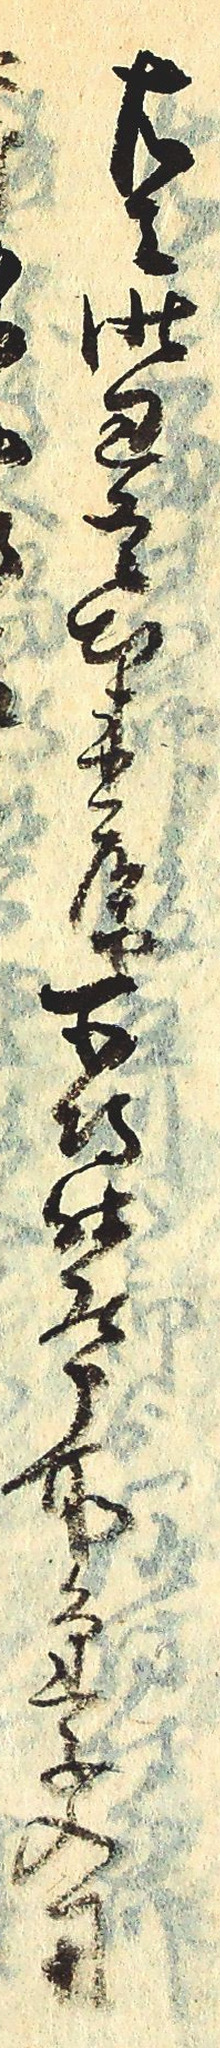右は昨丑冬出来蒅所持仕居申所金子入用
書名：諸御願書控(弐番）
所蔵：鳴門教育大学 Naruto University of Education
